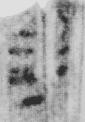爲
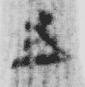之
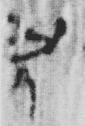死
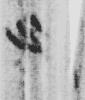又（有）
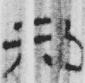亓（其）
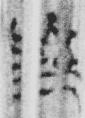爲
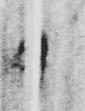人
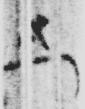之
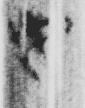女（如）
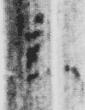也
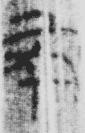不
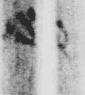又（有）
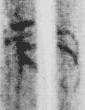夫
